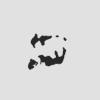取
